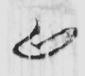㠯（以）
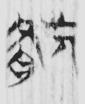{夊肉犬}
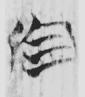於
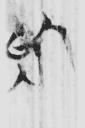{允夂}
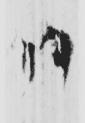{瓜瓜}
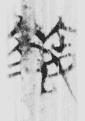{竹執}
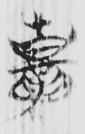{由革}
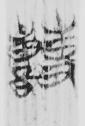{喜專}
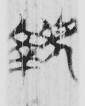{幸虎}
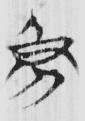{𠂊？儿}（穫）
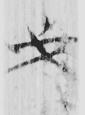戈
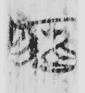盾
